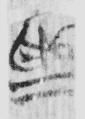爲
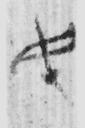民
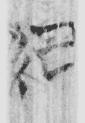紀
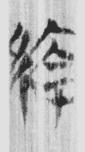{糸亢}
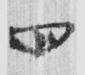四
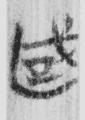或
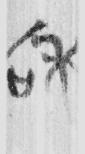和
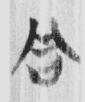同
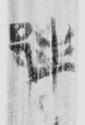邦
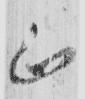㠯（以）
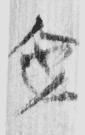安
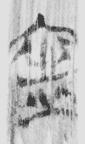{穴心皿}
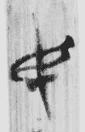民
